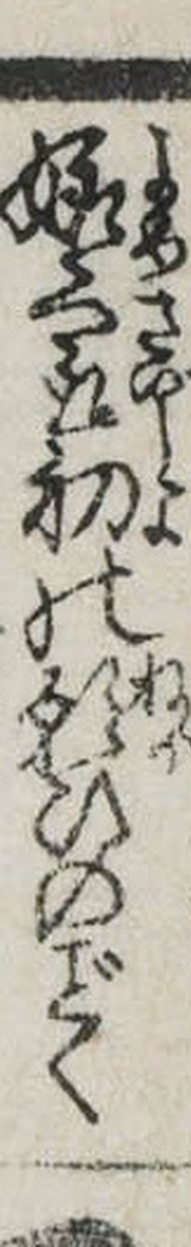娵最初の願ひのごとく
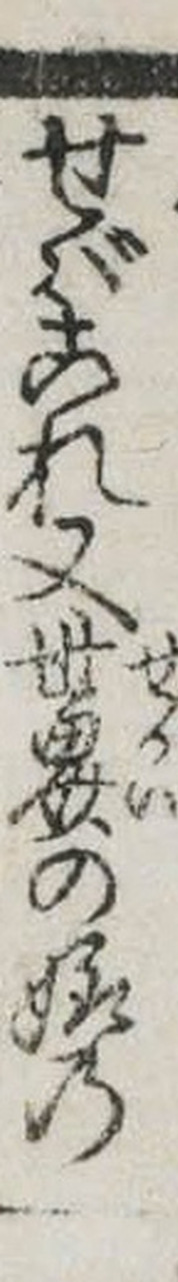せばこれ又世界の娵の
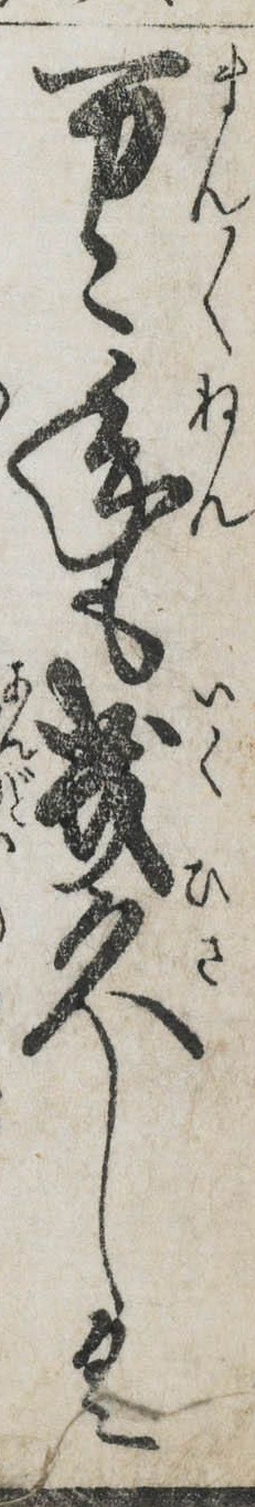万々年も幾久しく
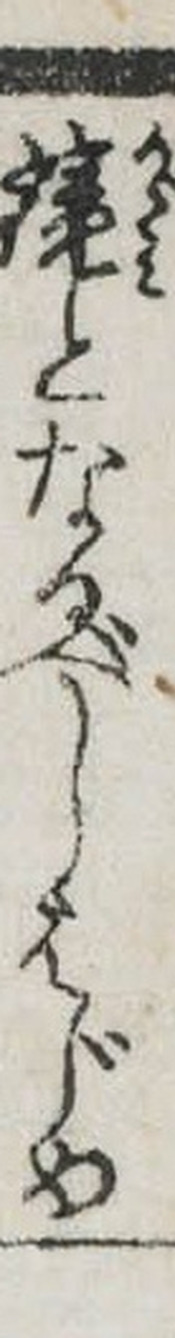鑑となるべしはじめ
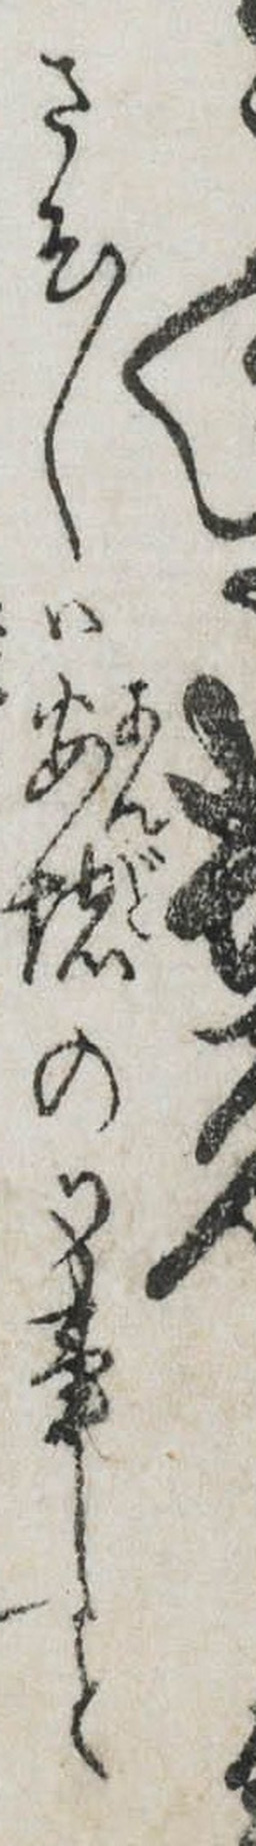さそ〳〵御安堵の御事と
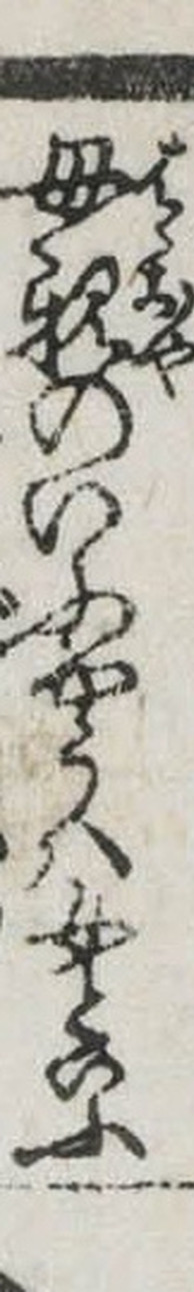母親のいふやうは女といふ
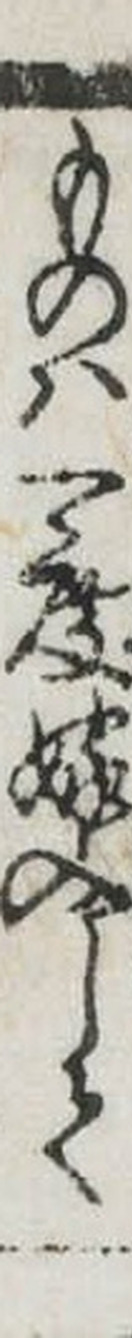ものは一度嫁入して
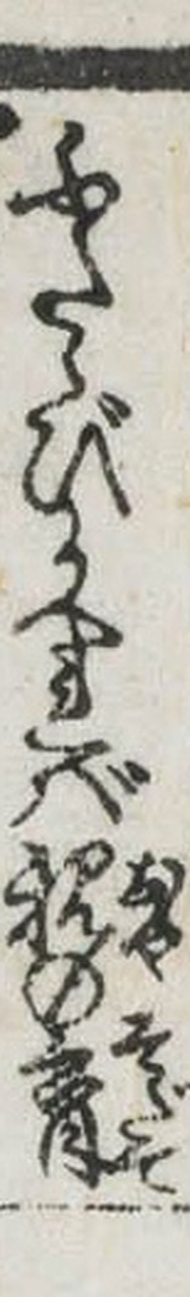ふたゝびかへれば親の育
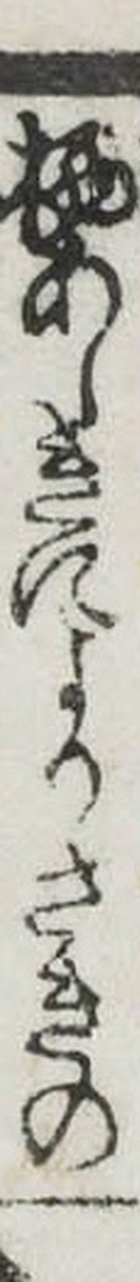柄あしきによりさきの
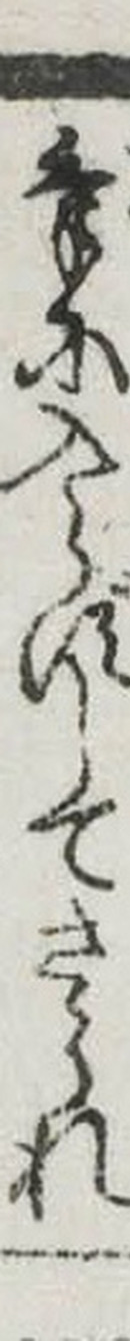気に入らずしてさられ
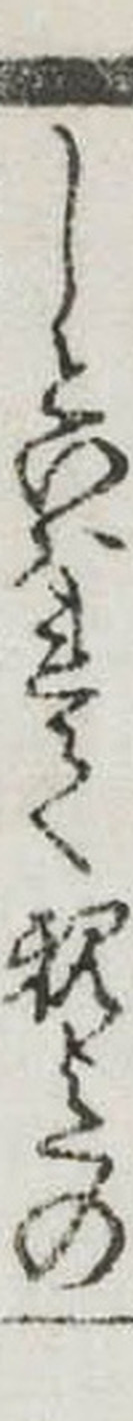しといはれて親迄の
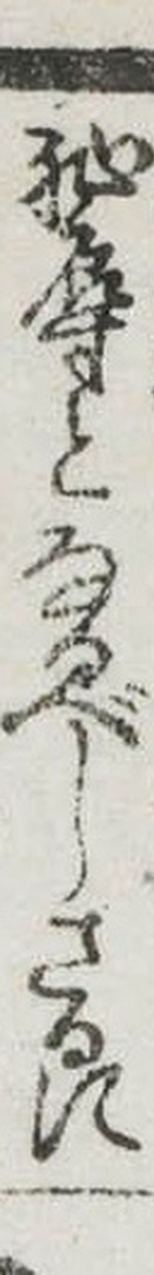恥辱となるべしさるに
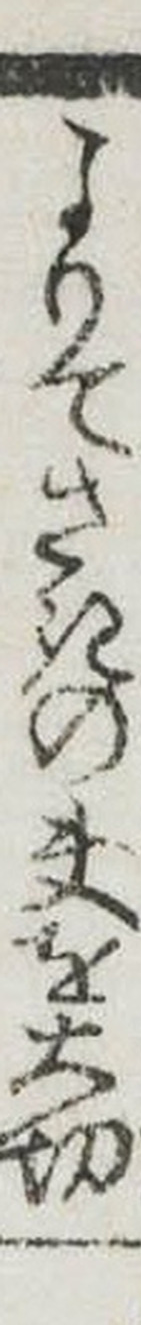よりてさきの夫を大切
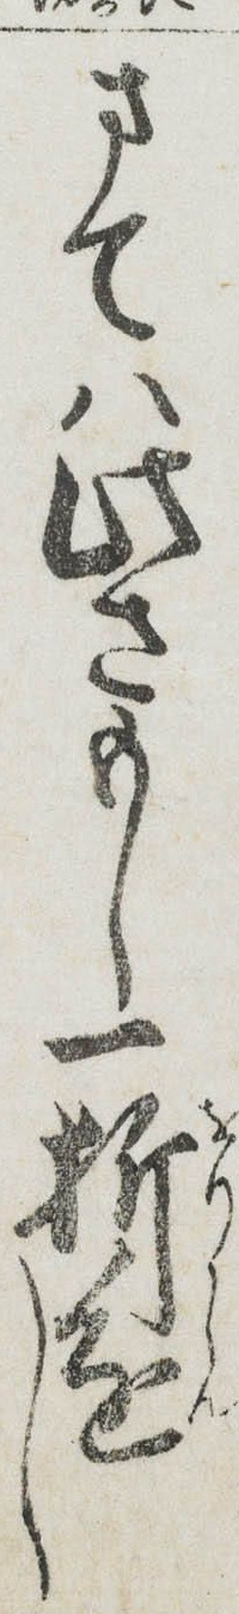さては此さもし一折進し
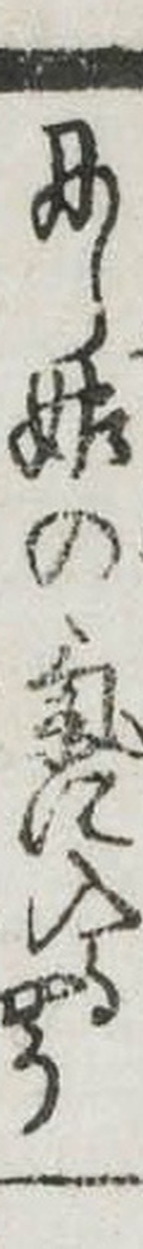にし姑の気に入るやう
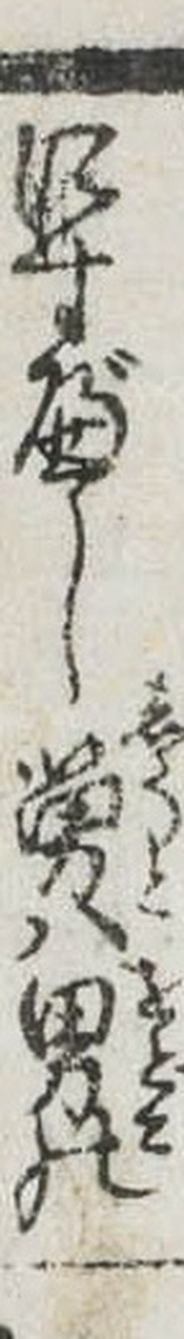にすべし舅は男の
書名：頭書萬用婦人手紙之文言
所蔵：東京学芸大学教育コンテンツアーカイブ
